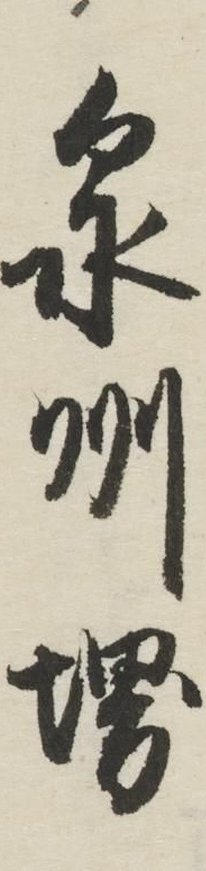泉州堺
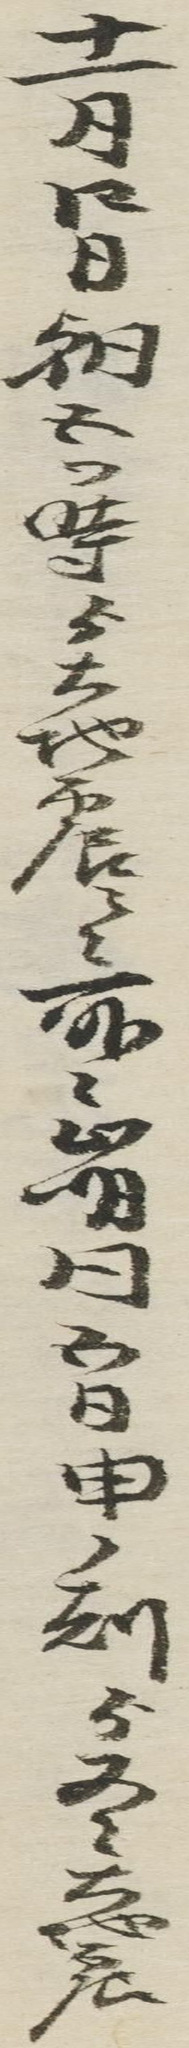十一月四日朝五ッ時ゟ大地震ニて所々崩同五日申ノ刻ゟ又々大地震

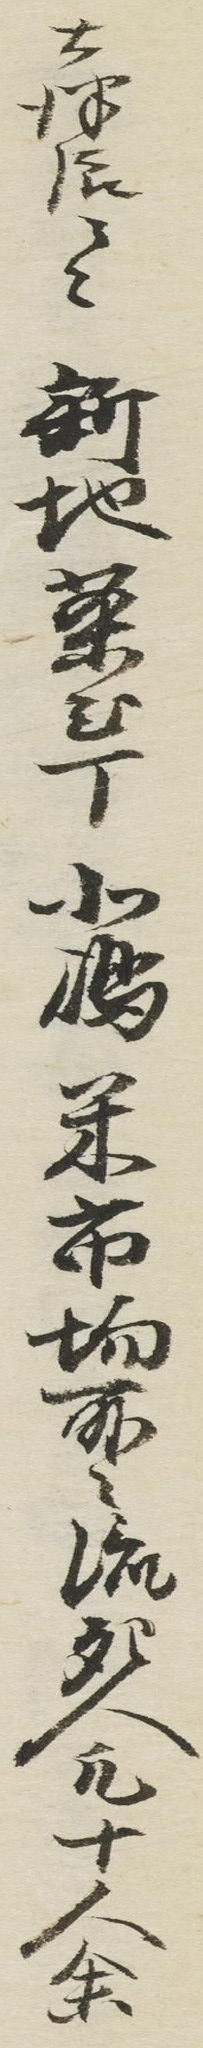大津浪ニて新地茶屋丁北嶋米市場所々流死人凡十人余
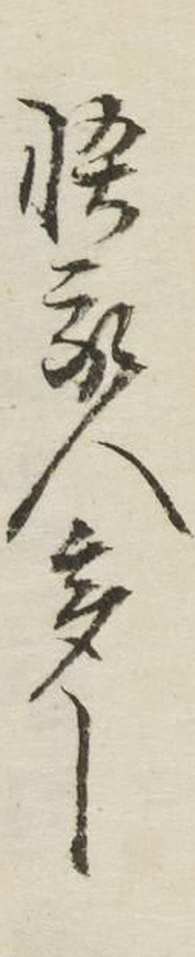怪我人多し
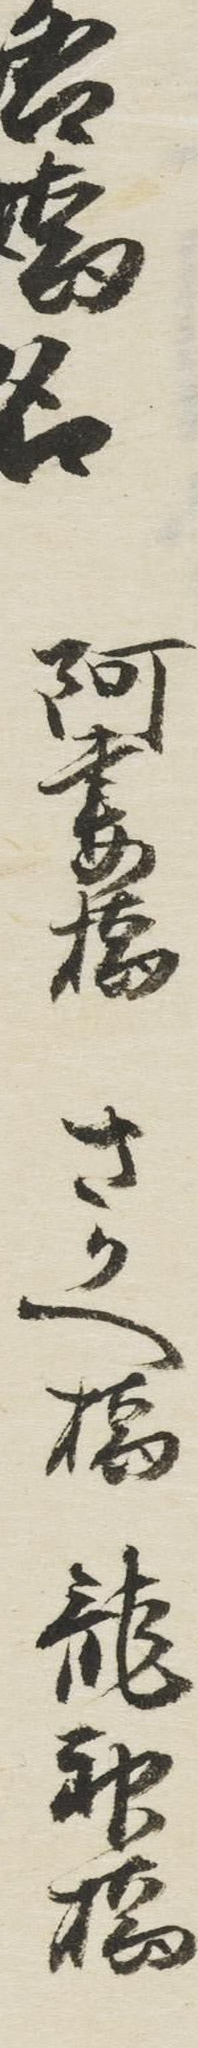落橋名吾妻橋さかへ橋龍神橋
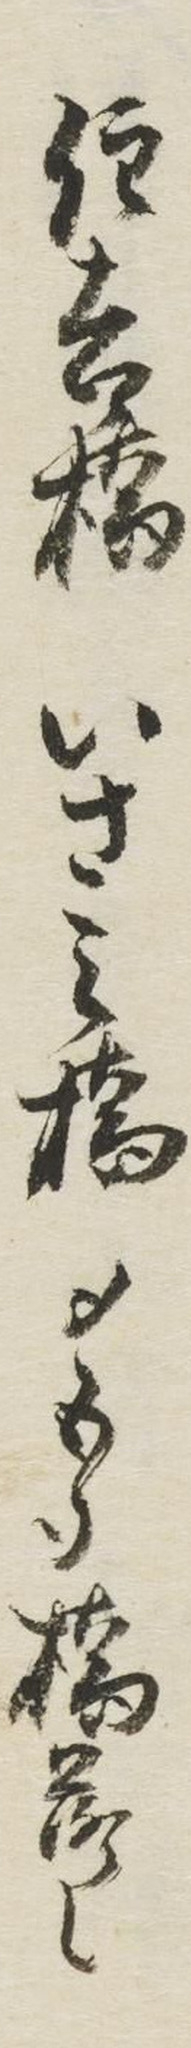住吉橋いさミ橋〆五ツ橋落し
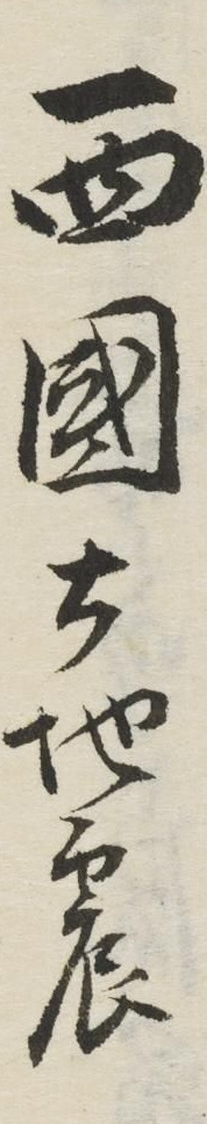西国大地震
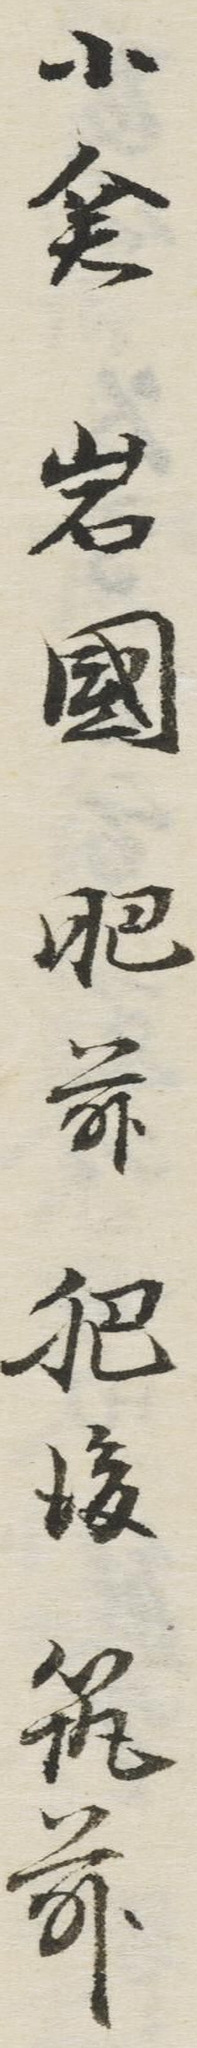小倉岩国肥前肥後筑前
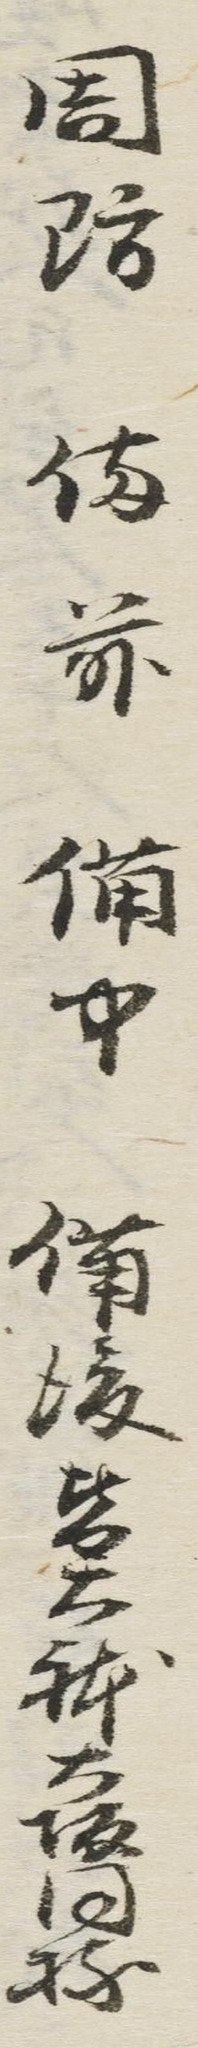周防備前備中備後皆大体大坂同様
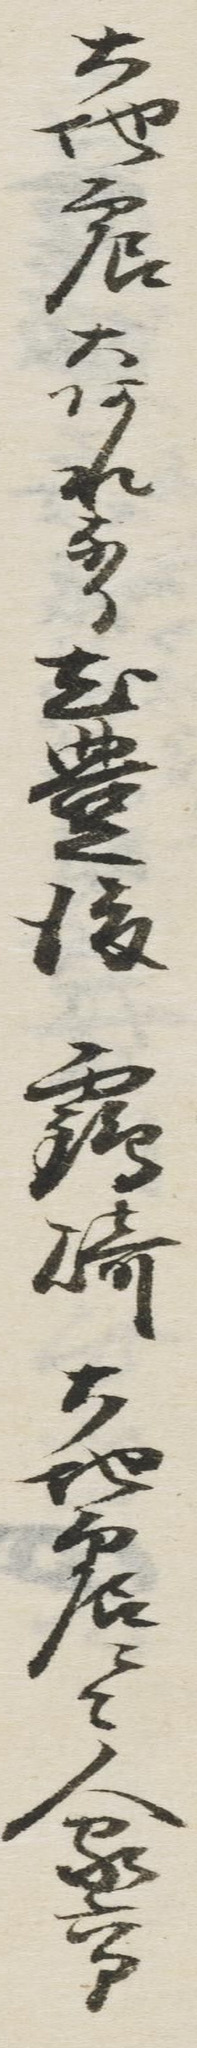大地震大あれなり尤豊後鶴崎大地震二て人家六部
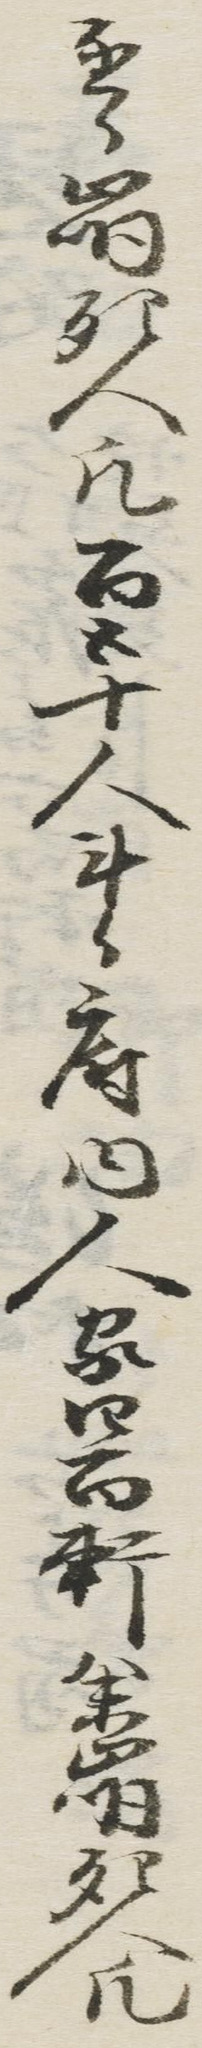通り崩死人凡百五十人斗り府内人家四百軒余崩死人凡
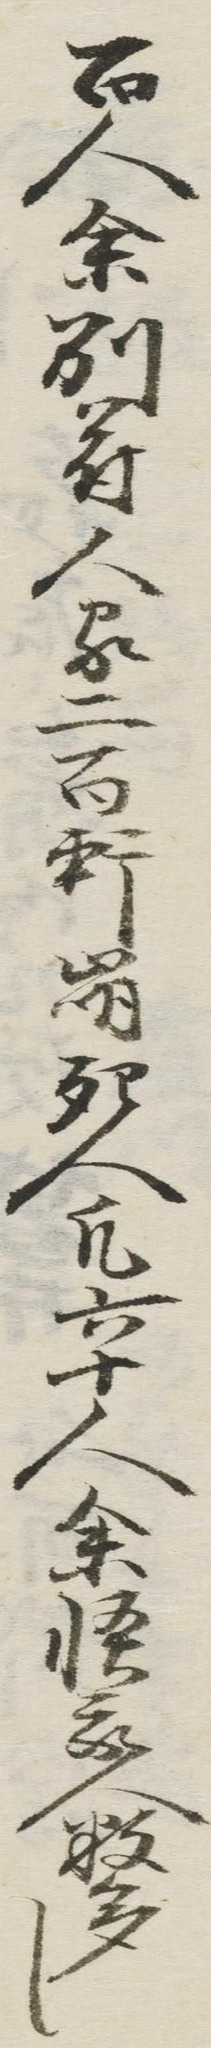百人余別府人家二百軒崩死人凡六十人余怪我人数多し有之
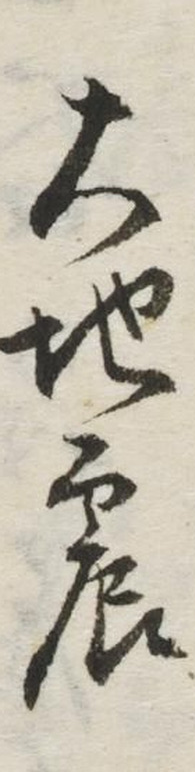大地震
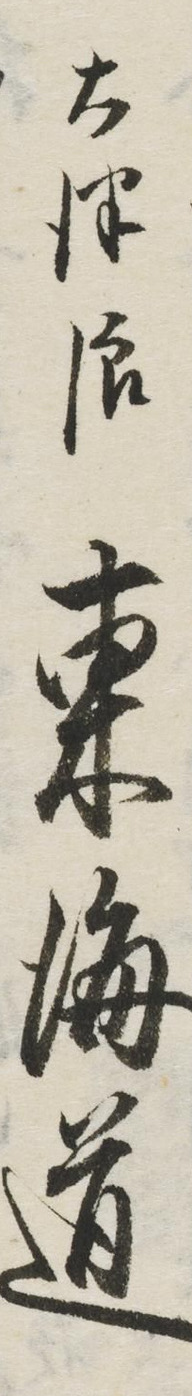大津浪東海道
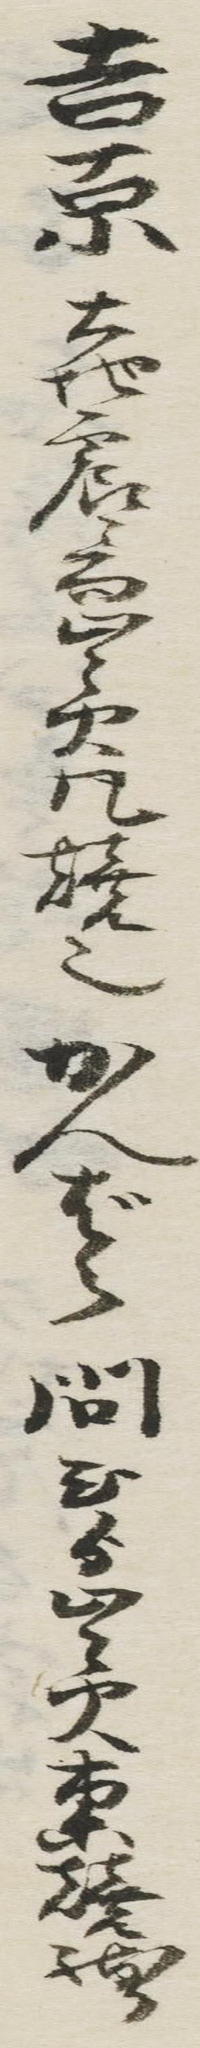吉原大地震に而出火丸焼也かんばら問屋ゟ出火東末焼残り
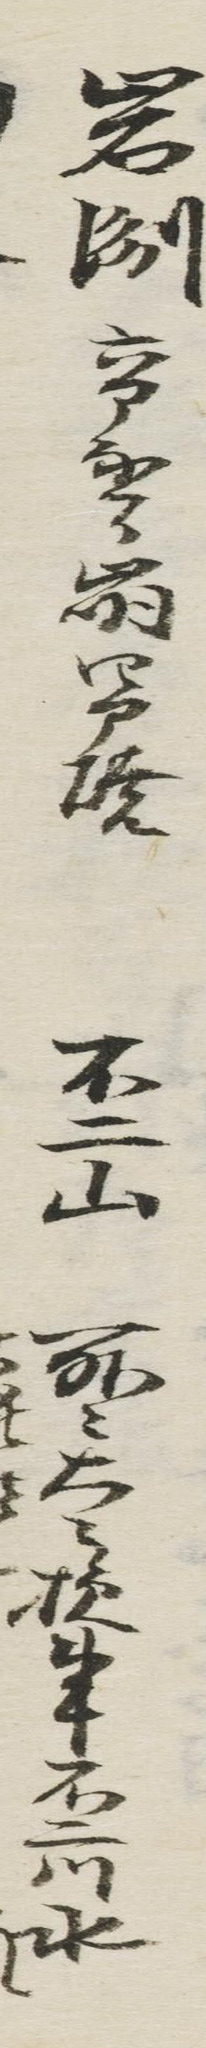岩淵六部通り崩四部焼不二山所々大ニ損不二川水なし
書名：諸国大地震大津波一代記
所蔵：東京大学地震研究所図書室 Earthquake Research Institute Library, The University of Tokyo, JAPAN
